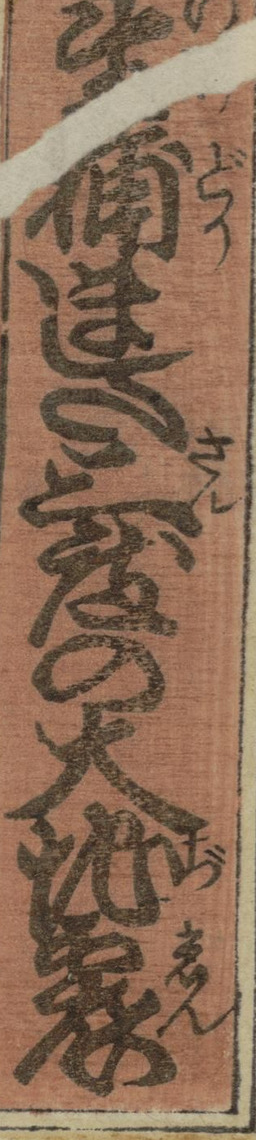生捕ました三度の大地震
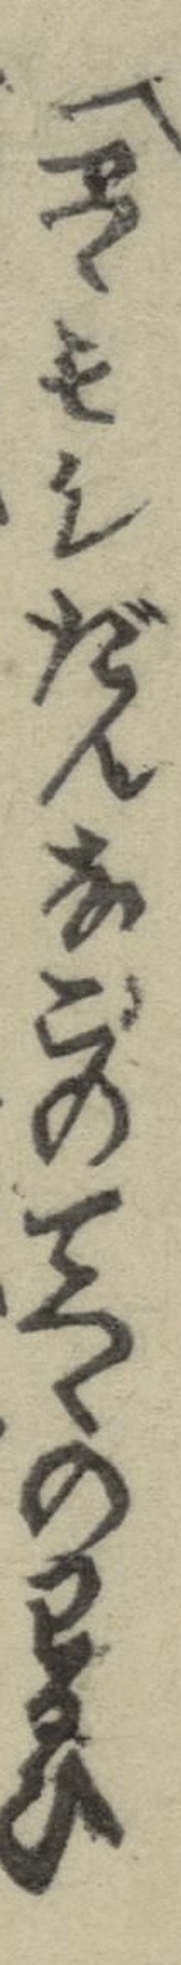〽エヽモシだんなこのてへくのわるひ
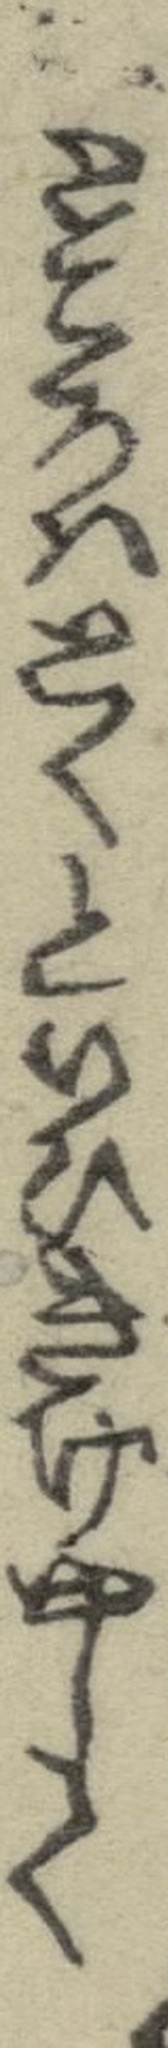ところはとくといひきけやして
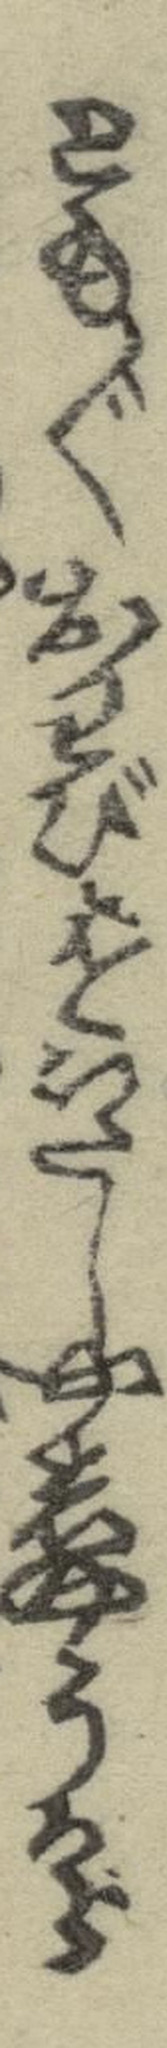とも〴〵おわびをいたしやしやうから
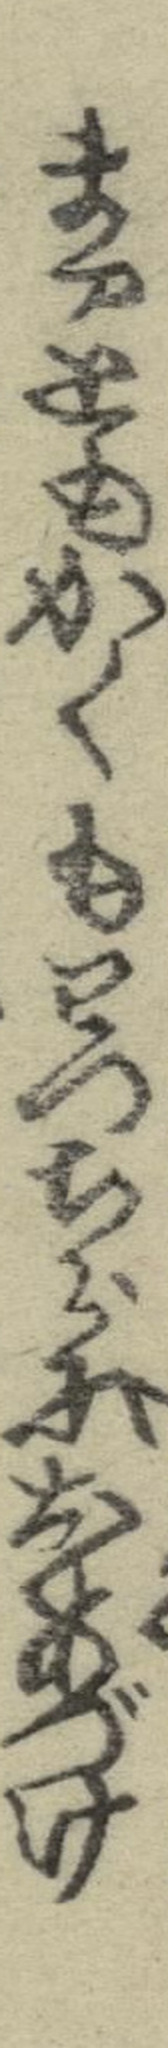まアともかくもわつちらにおあづけ
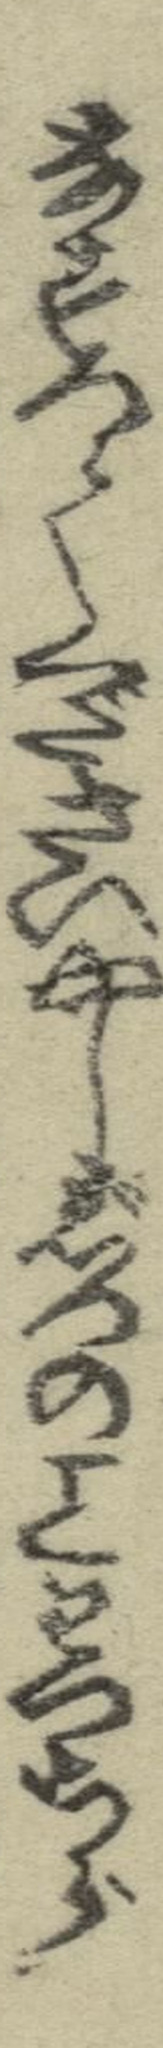なすつてくださいやしじつのことわつちら
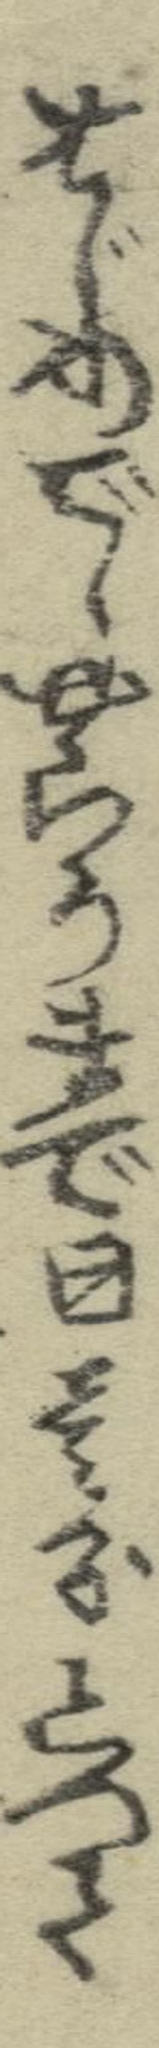はじめでしやらうまで日壱分とつて
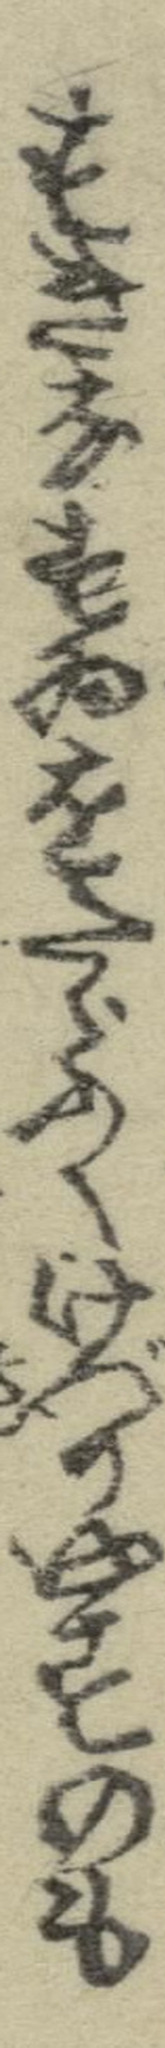すきなものをたらふくけづりやすのも
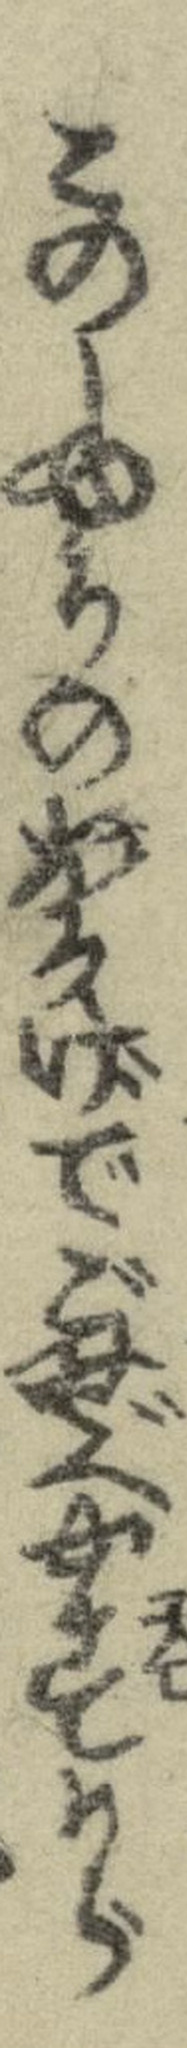このしゆうのおかげでごぜへやすから
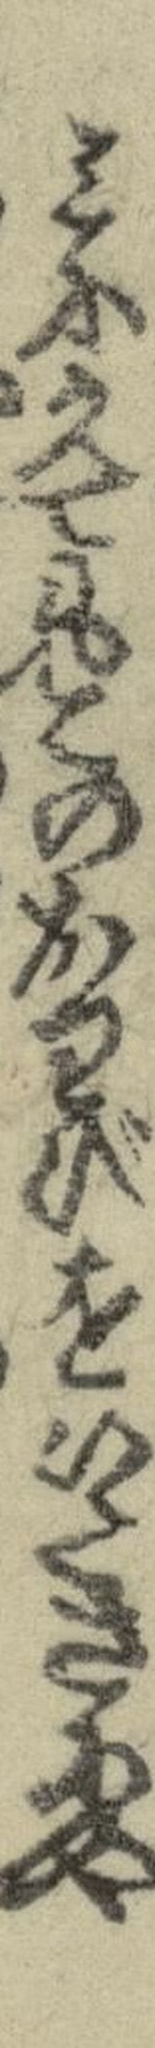みにかへてもこのおわびをいたさにや
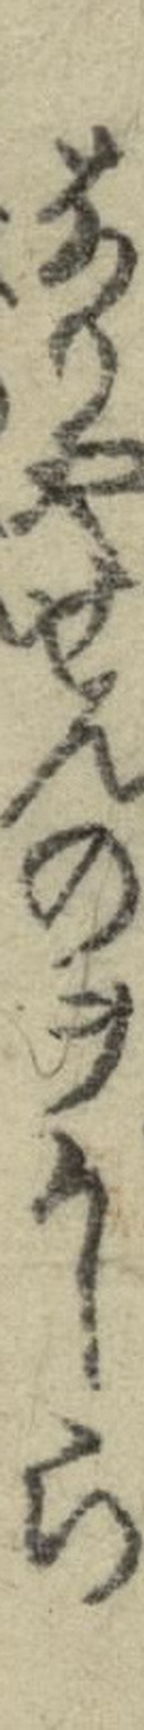なりやせんのヲかしら
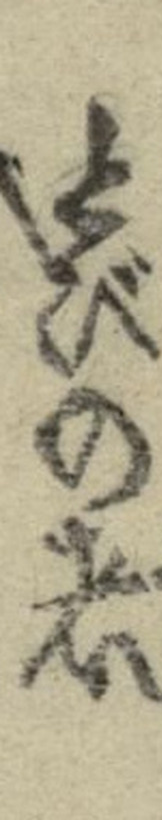とびの者
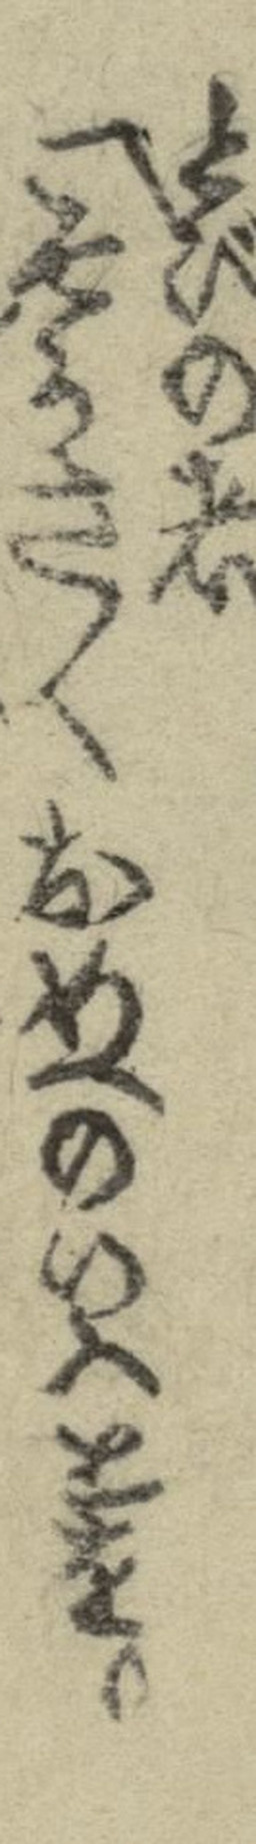〽そうさ〳〵おめへのいうとをり
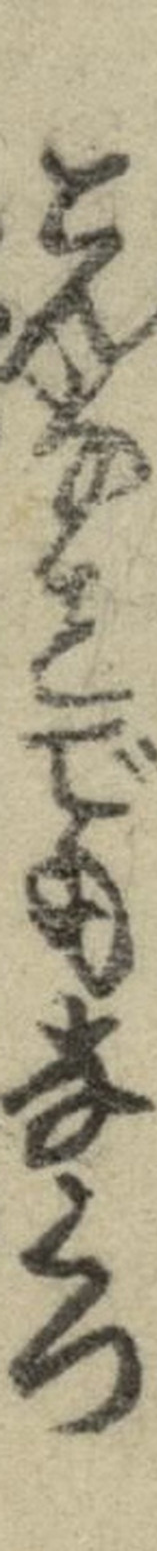こんなことでもなくつ
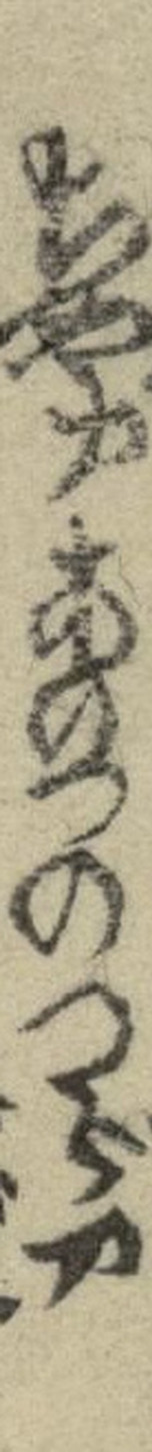ちやアあいつのつらア
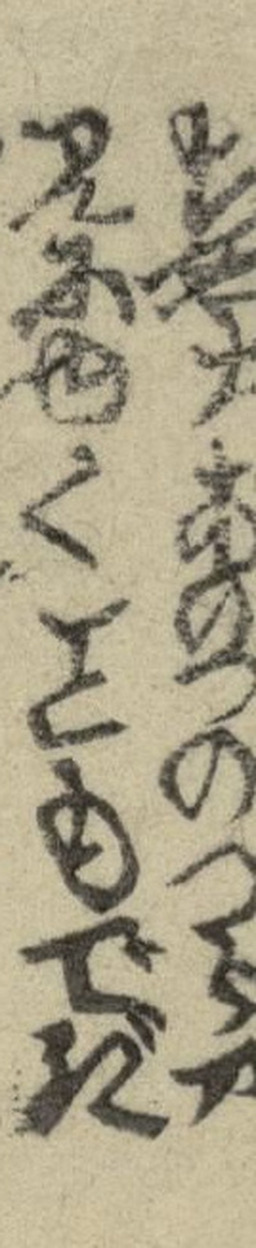みにゆくこともでき
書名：生捕ました三度の大地震
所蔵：東京大学地震研究所図書室 Earthquake Research Institute Library, The University of Tokyo, JAPAN
